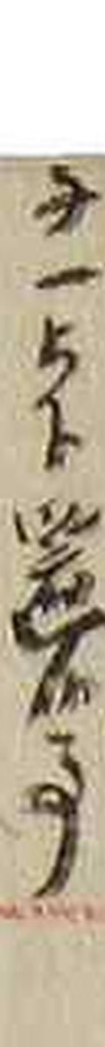子一被下置候事
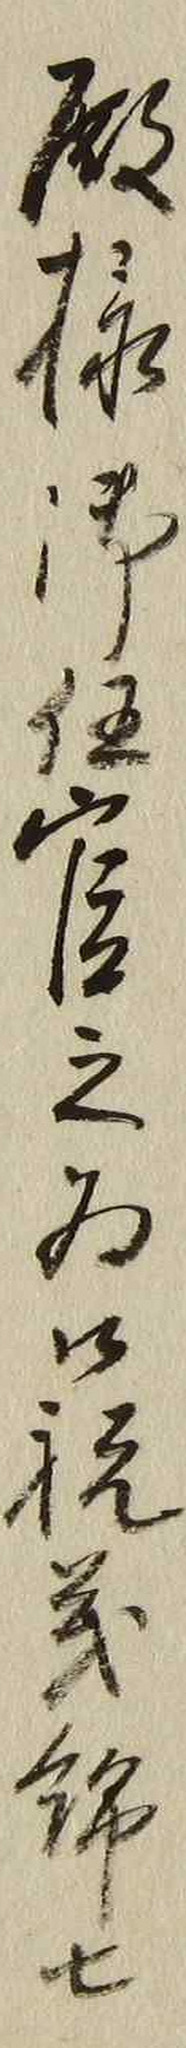殿様御任官之為御祝義綿七
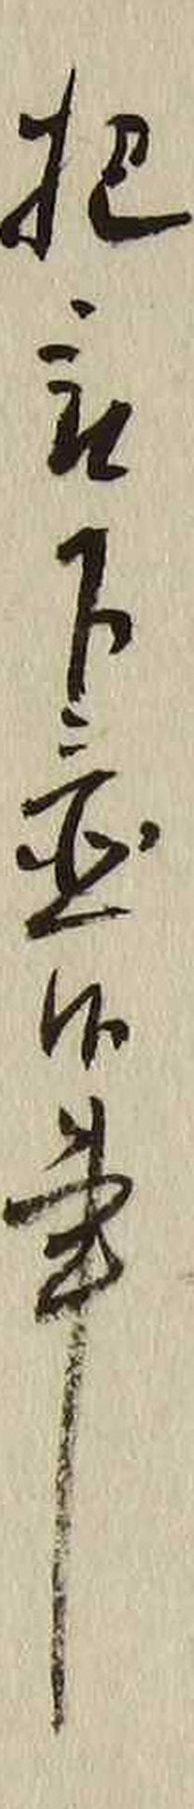把被下置候事
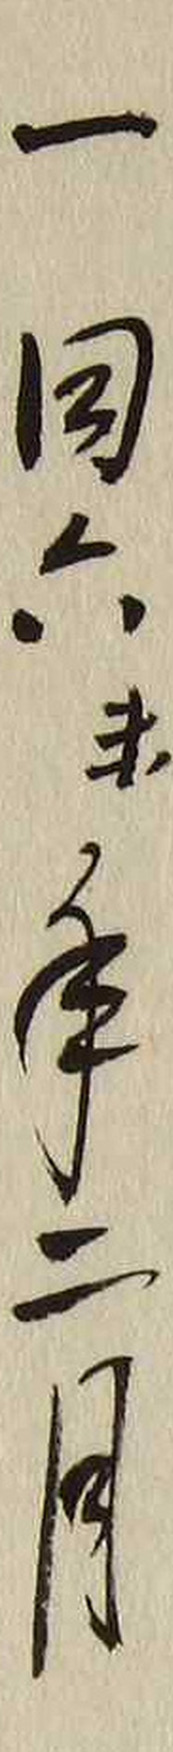一同六未年二月
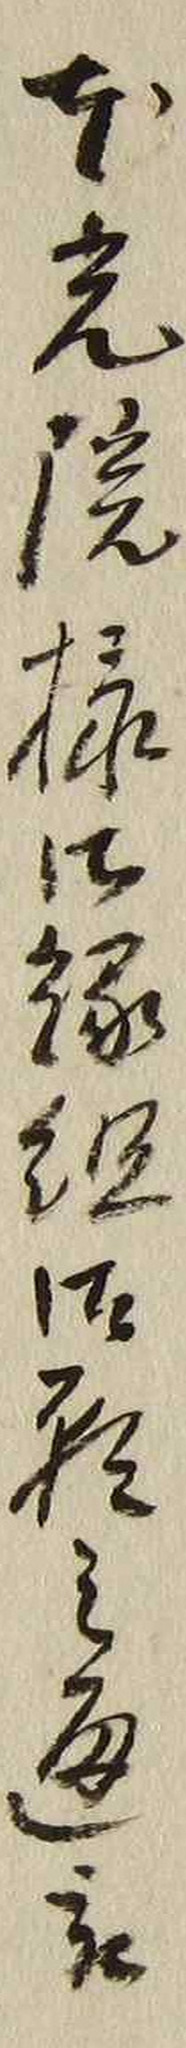本光院様御縁組御願之通被
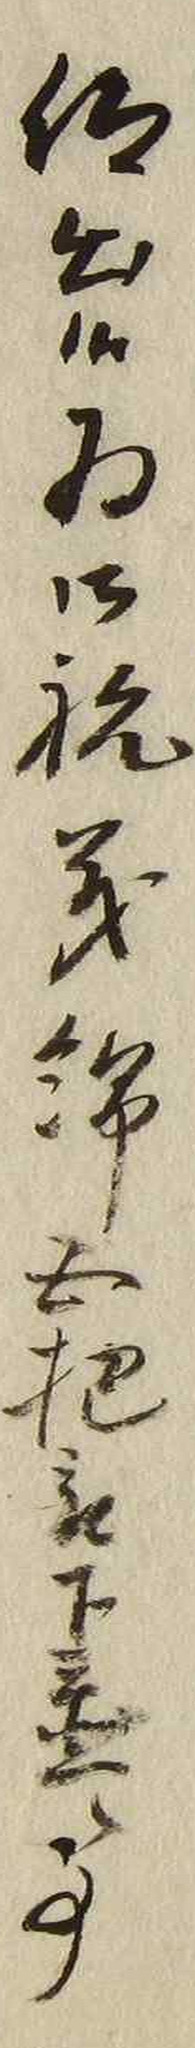仰出候為御祝義綿五把被下置候事

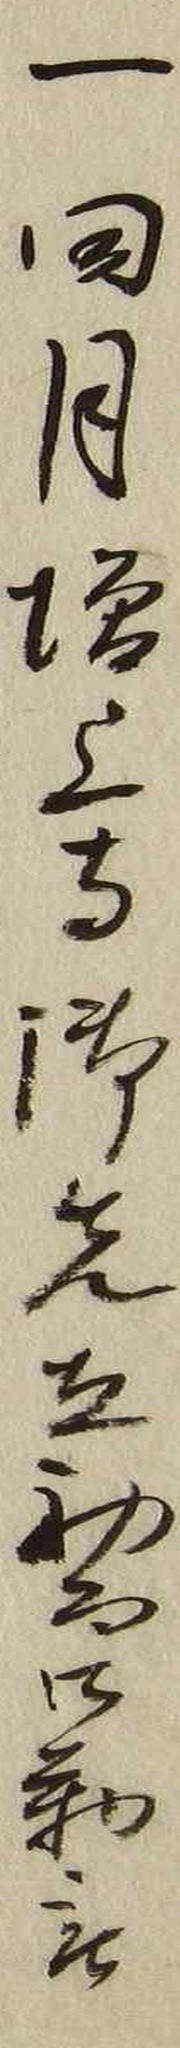一同月増上寺御先立初而御勤被
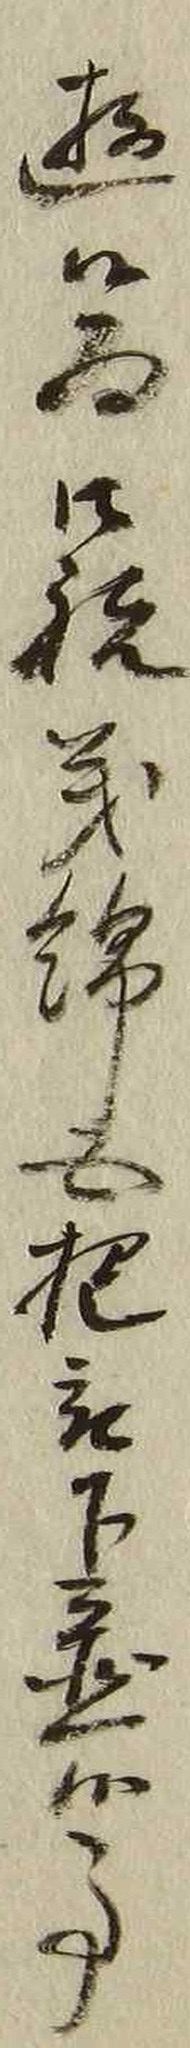遊候為御祝義綿五把被下置候事
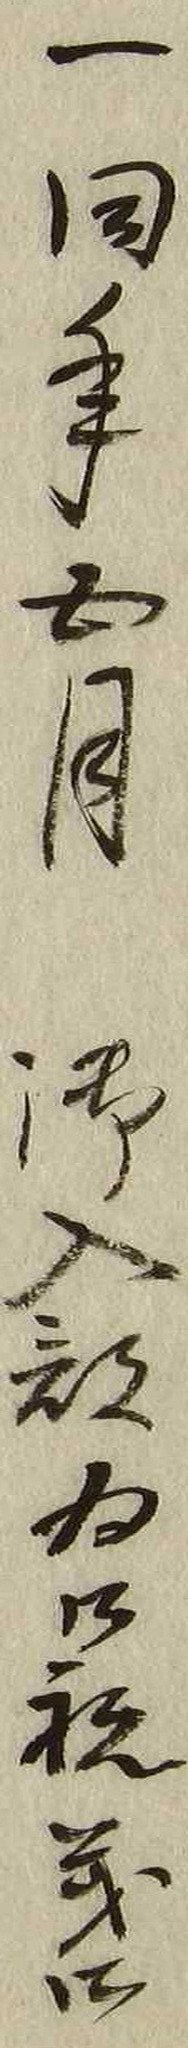一同年五月御入部為御祝義御
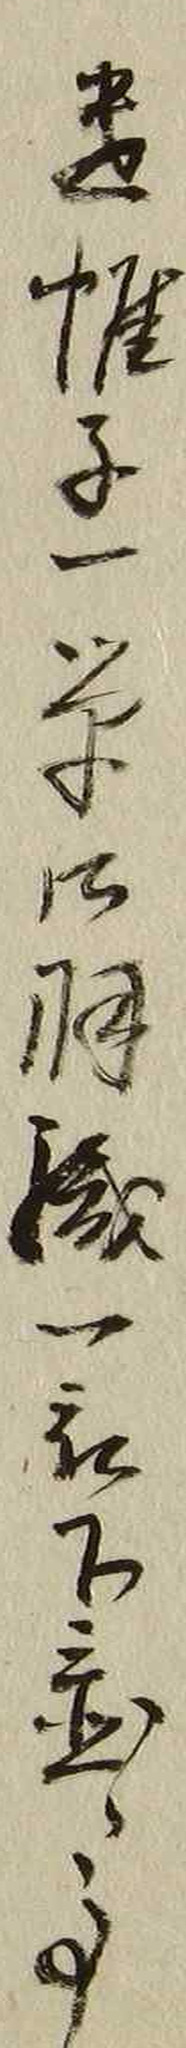遺帷子一単御羽織一被下置候事
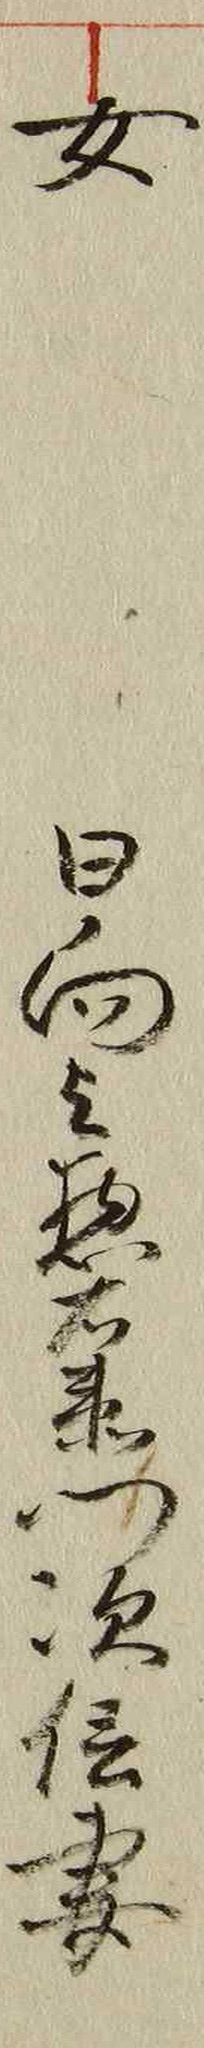女日向与惣右衛門次信妻
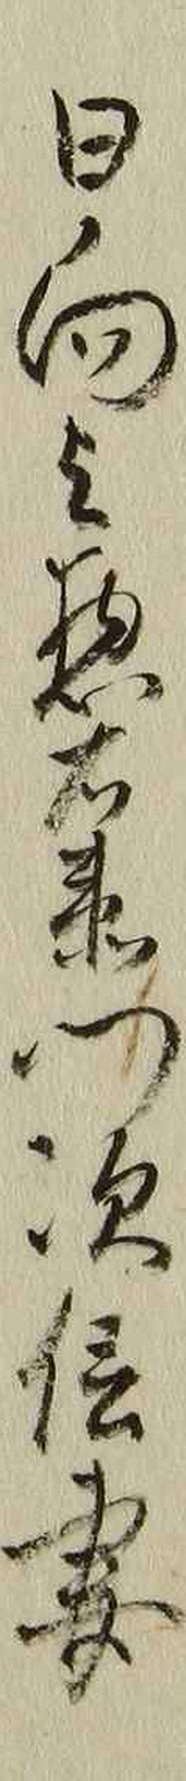女日向与惣右衛門次信妻
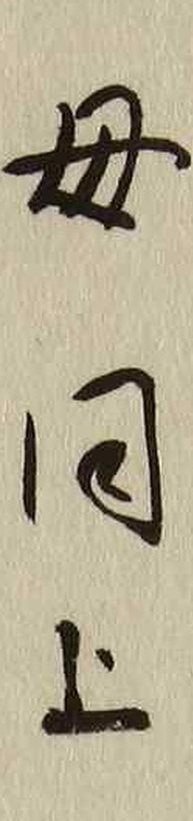母同上
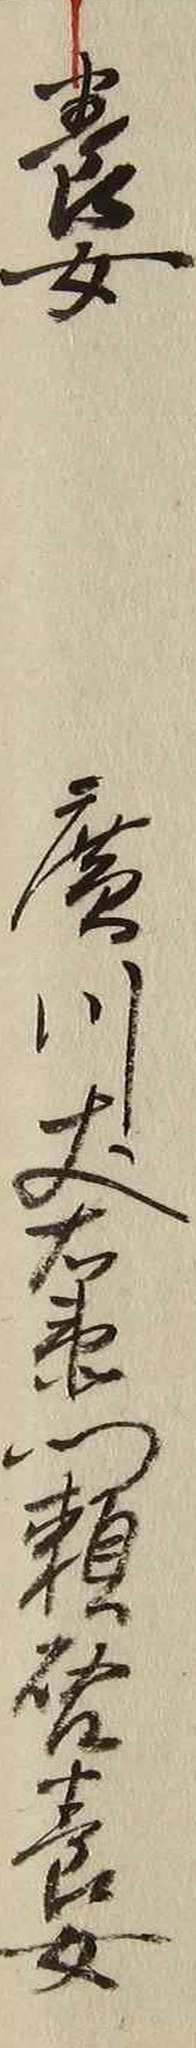養女広川丈右衛門頼啓養女
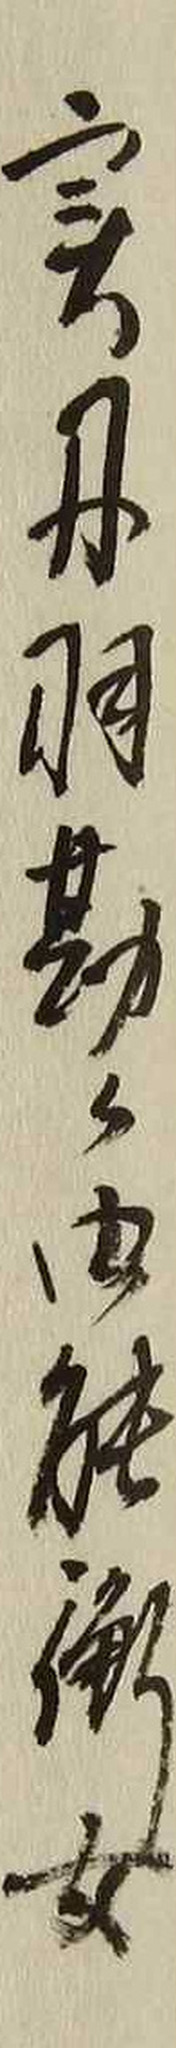実丹羽勘ケ由能衡女
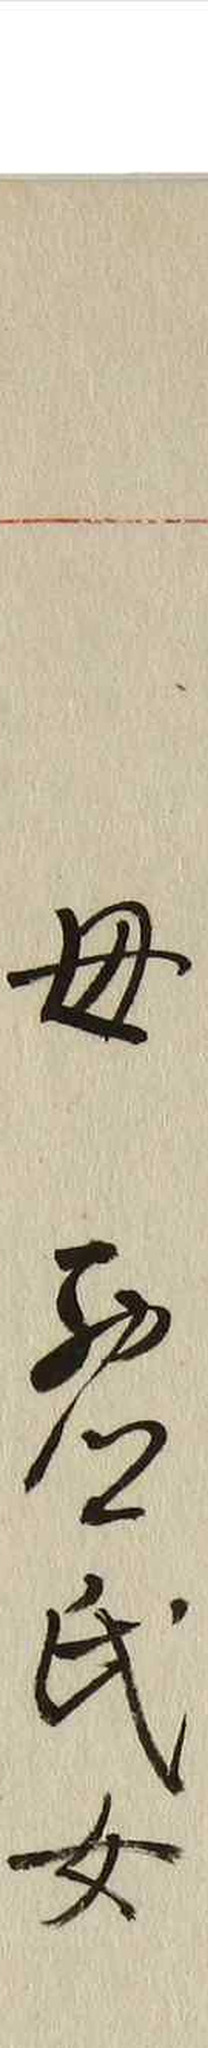母西郷氏女
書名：諸士系譜　巻之351　す之部1
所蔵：会津若松市立会津図書館
